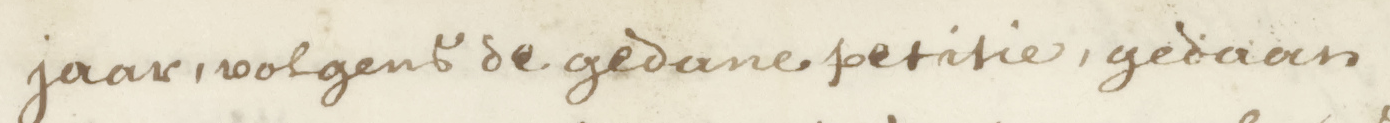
jaar, volgens de gedane petitie, gedaan
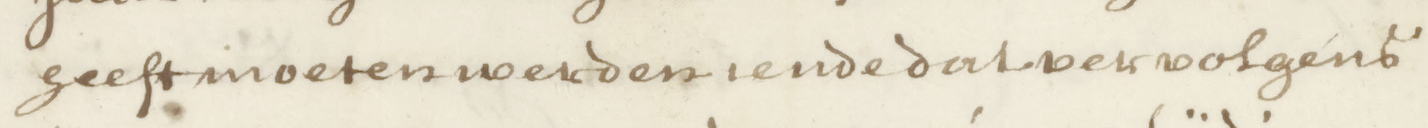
heeft moeten werden, ende dat vervolgens
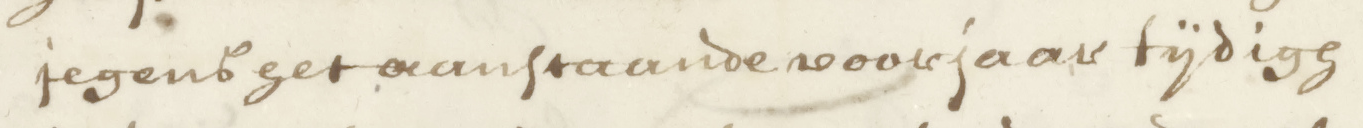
jegens het aanstaande voorjaar tijdigh
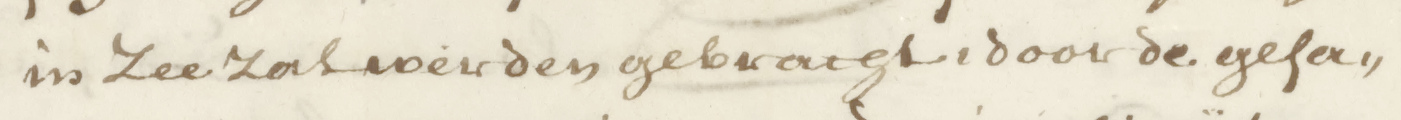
in Zee zal werden gebracht, door de gesa„
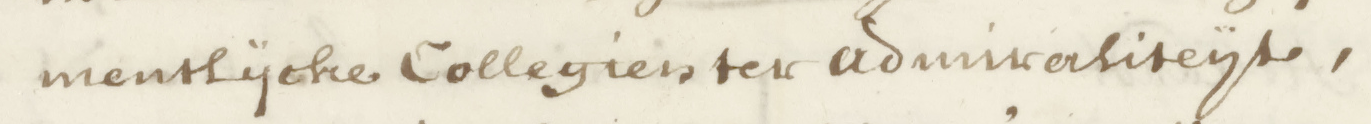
mentlijcke Collegien ter admiraliteijt,
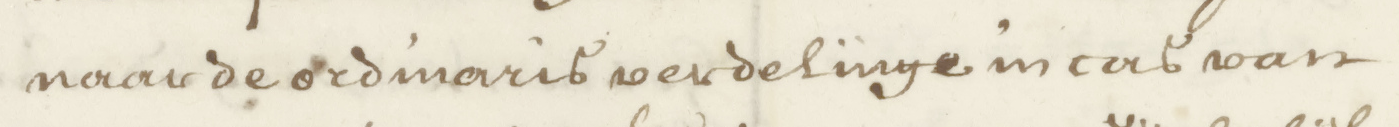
naar de ordinaris verdelinge in cas van
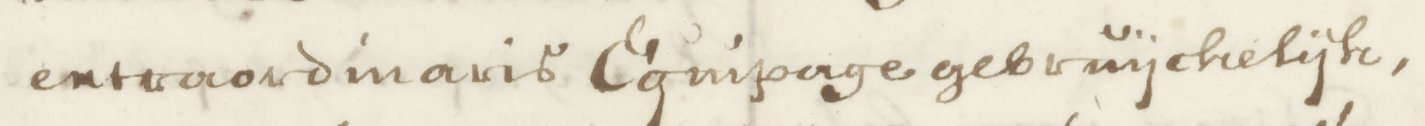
extraordinaris Equipage gebruijckelijk,
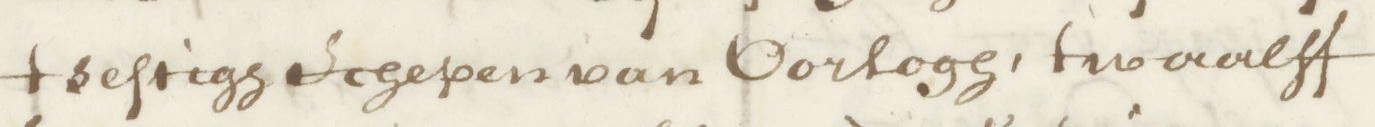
t sestigh Schepen van Oorlogh, twaalff
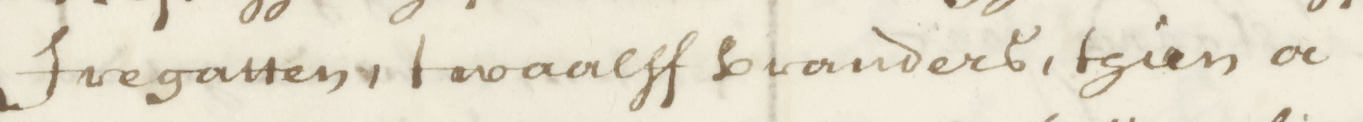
fregatten, twaalff branders, thien a
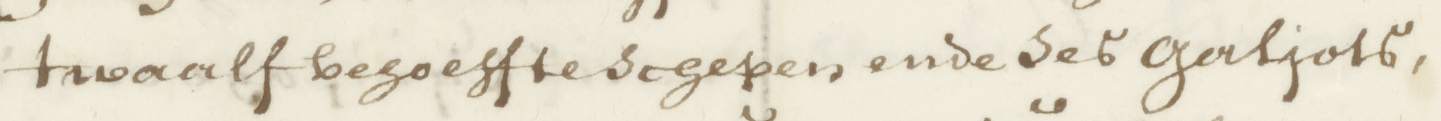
twaalf behoeffteschepen ende ses galjots,
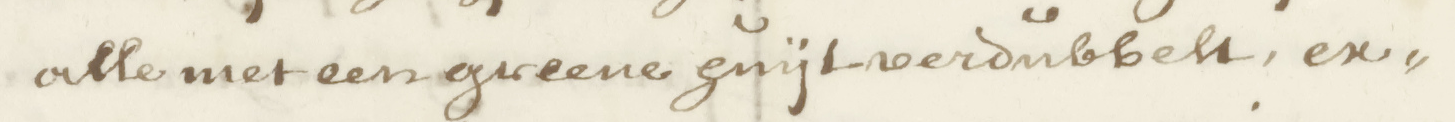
alle met een greene huijt verdubbelt, ex„
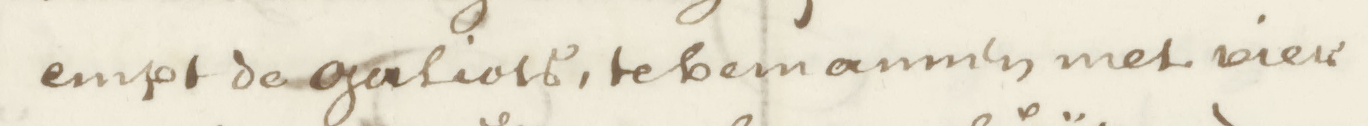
empt de galiots, te bemannen met vier
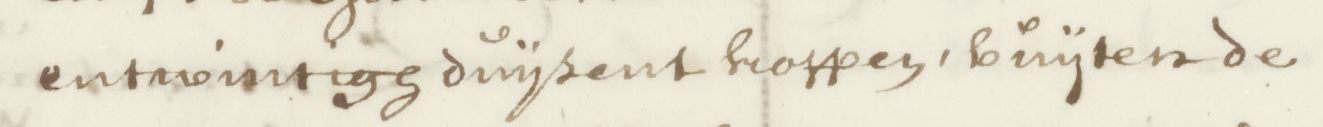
entwintigh duijsent koppen, buijten de
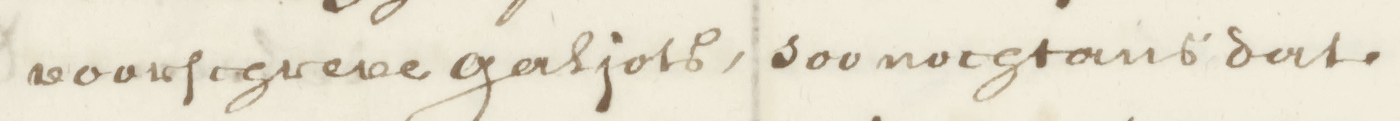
voorschreve galjots, soo nochtans dat
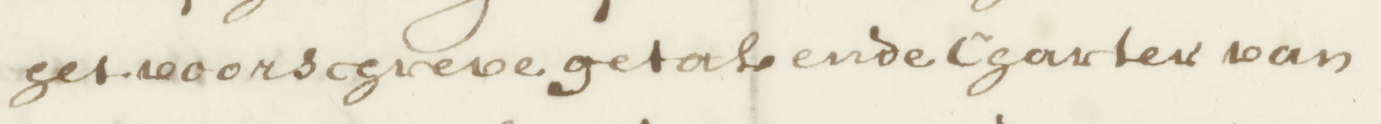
het voorschreve getal ende Charter van
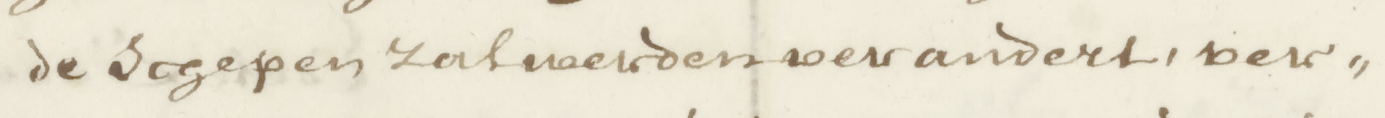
de Schepen zal werden verandert, ver„
